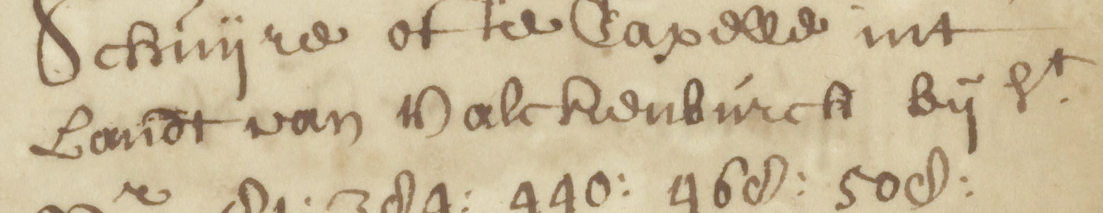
Landt van Valckenburch bij st.
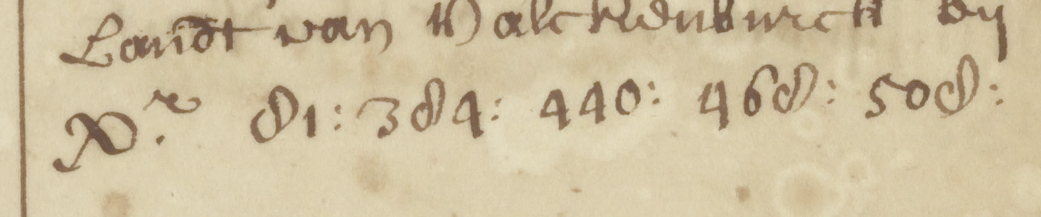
Pr. 81: 384: 440: 468: 508:
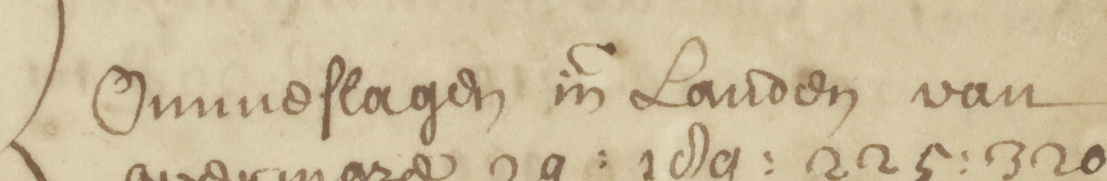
Ommeslagen in Landen van
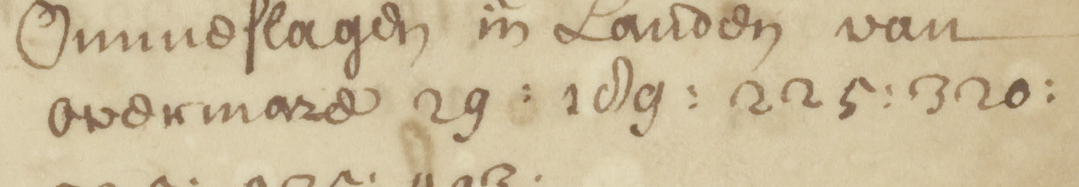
overmaze 29: 189: 225: 320:
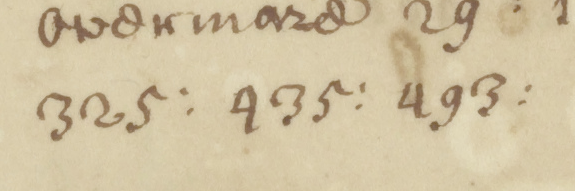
325: 435: 493:
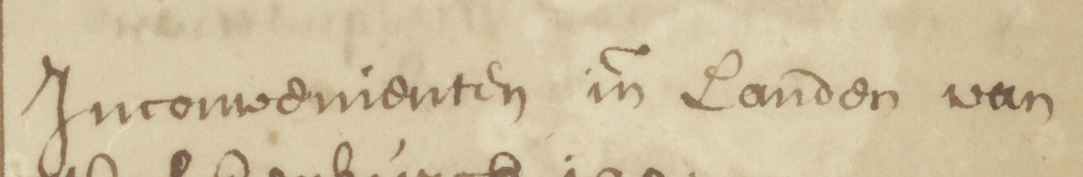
Inconvenienten in Landen van
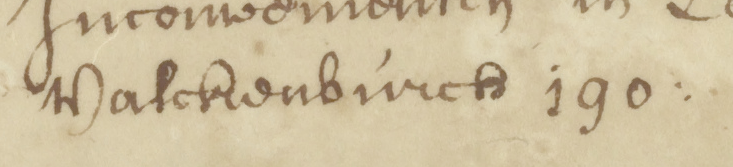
Valckenburch 190:
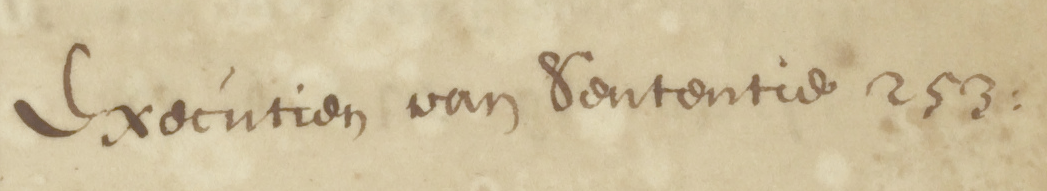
Executien van Sententie 253:
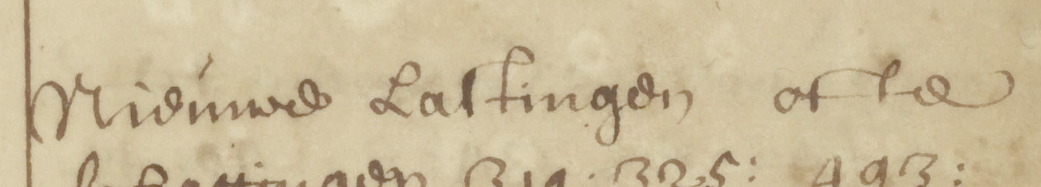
Nieuwe Lastingen ofte
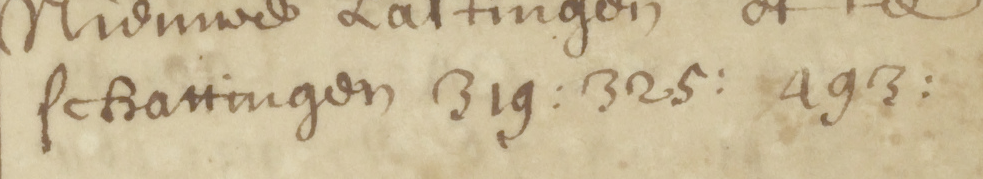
schattingen 319: 325: 493:
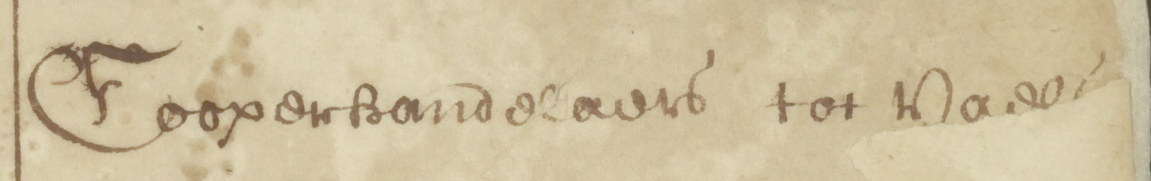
Cooperhandelaers tot Vael
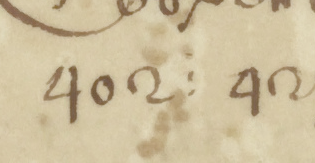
402: 427:
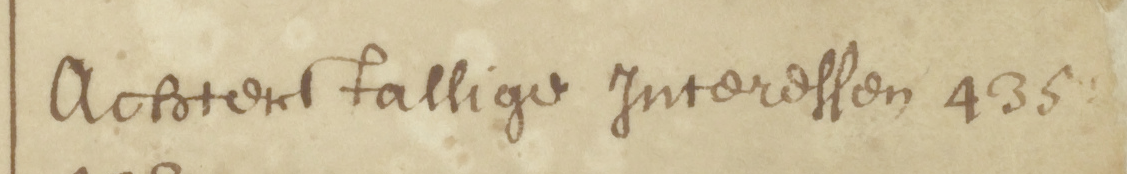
Achterstallige Interessen 435:
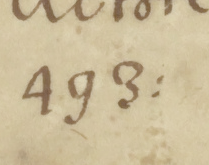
493:
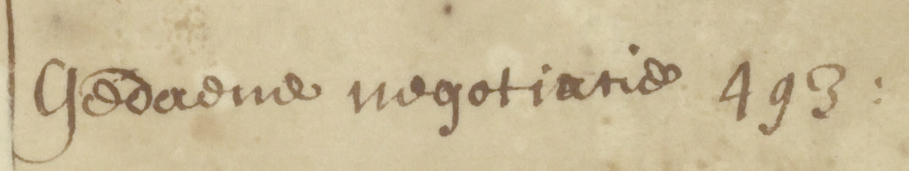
Gedaene negotiatie 493:
